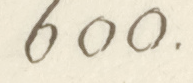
600
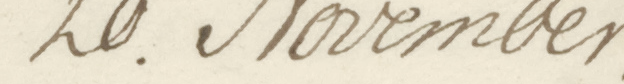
20. November
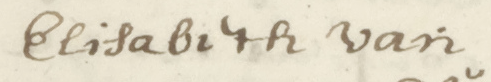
Elisabeth van
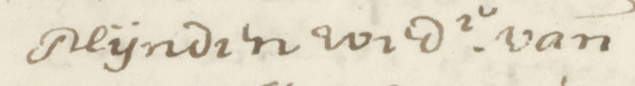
Mijnden wede van
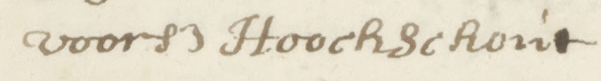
voorsz. Hoochschout
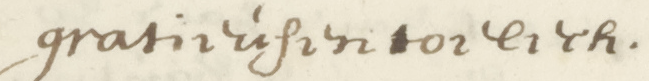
gratieusen toelech.
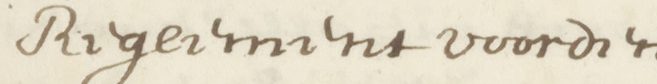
Reglement voorden
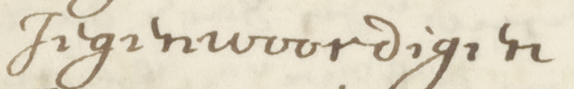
Jegenwoordigen
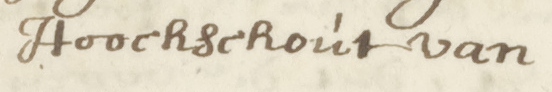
Hoochschout van
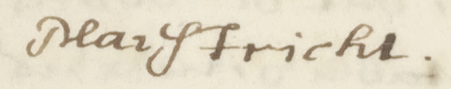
Maestricht
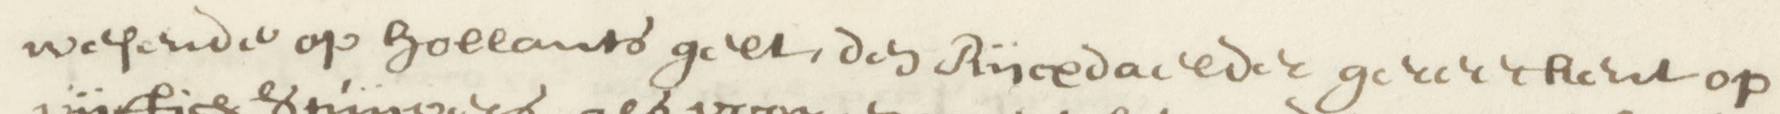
wesende op hollants gelt, den Rijcxdaelder gereeckent op
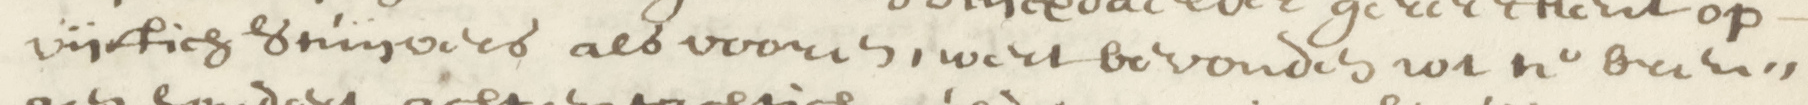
vijftich stuijvers als vooren, wert bevonden wt te bren„
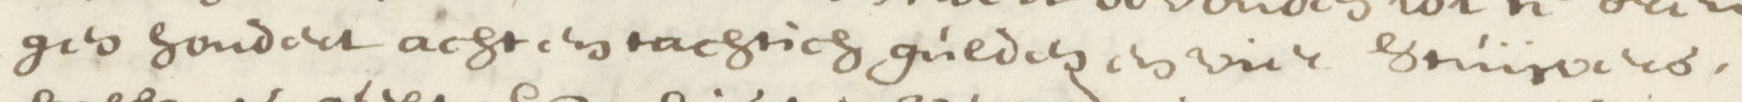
gen hondert achtentachtich gulden en vier stuijvers
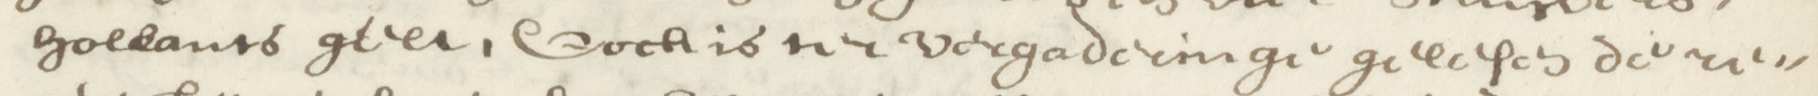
hollants gelt. Oock is ter vergaderinge geelesen de re„
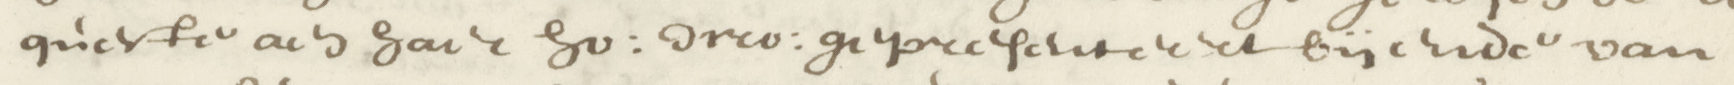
queste aen haere Ho:Mo: gepresenteert bij ende van
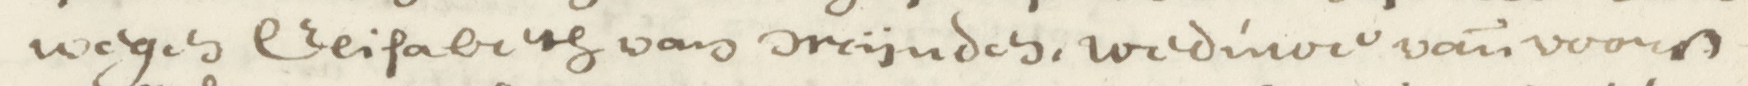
wegen Elisabeth van Mijnden, weduwe van voors
